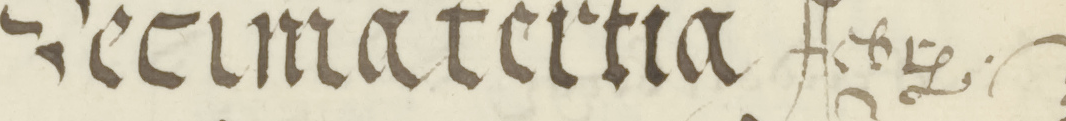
Decimatertia Febry:
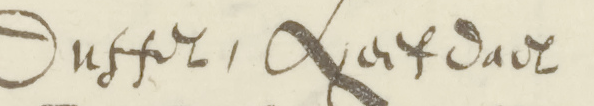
Duffel, Leefdael
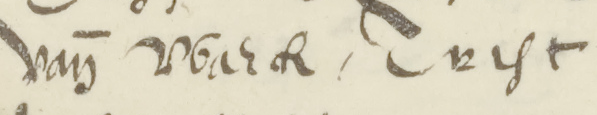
van Werck, Trist
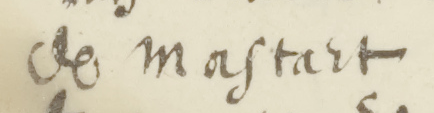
de Mastart
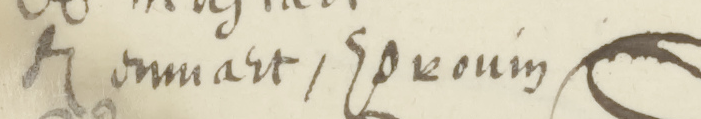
Kennaert, Prouin
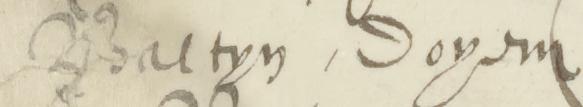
Baltyn, Doyem
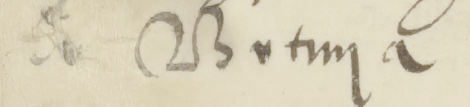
Botnya
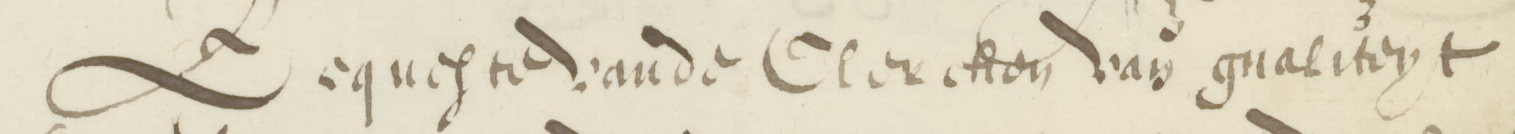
Requeste vande Clercken van gnaliteyt
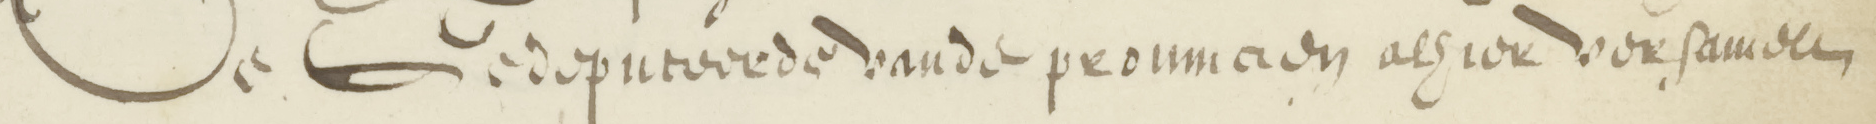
De Gedeputeerde vande provincien alhier versamelt
